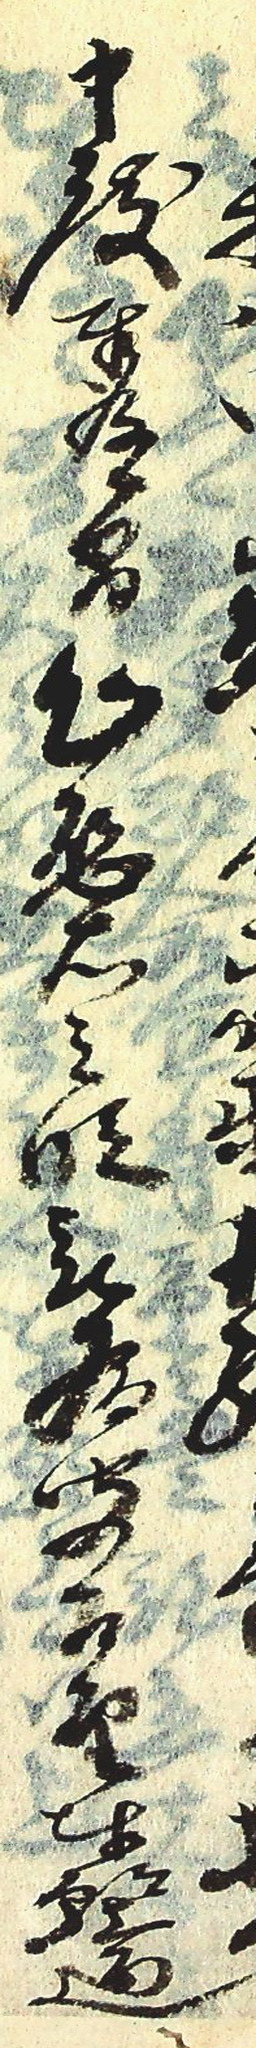申度奉存候間乍恐右之段被為聞召届奉願上通
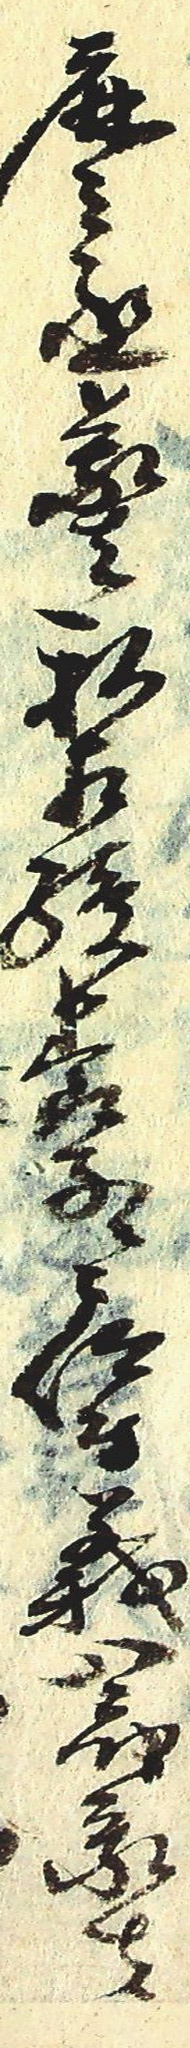麻之丞義は私相続養子に被仰付義八郎義は
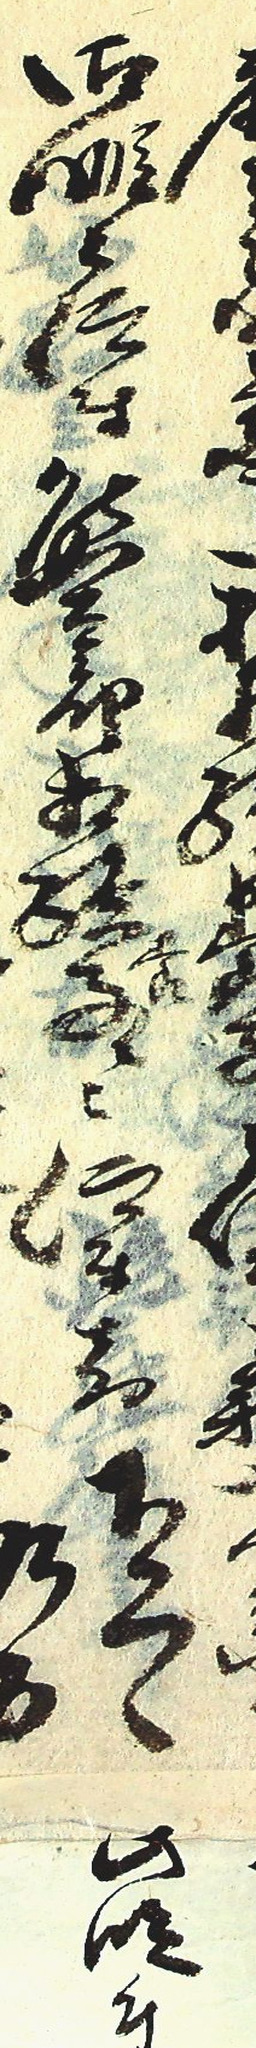御暇被仰付熊太郎相続養子に被仰付被為下候はゝ
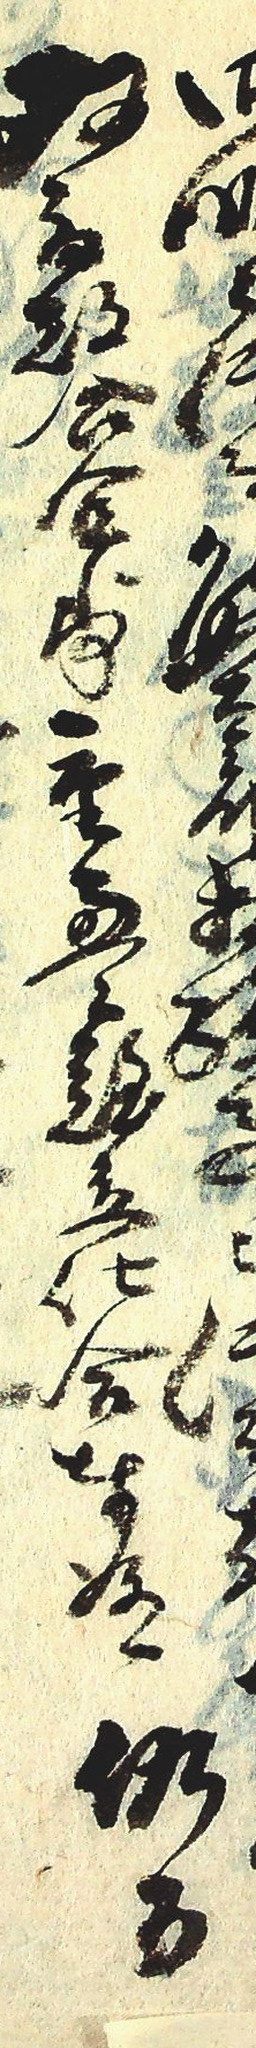双方都合宜布重畳難有仕合奉存候仍て
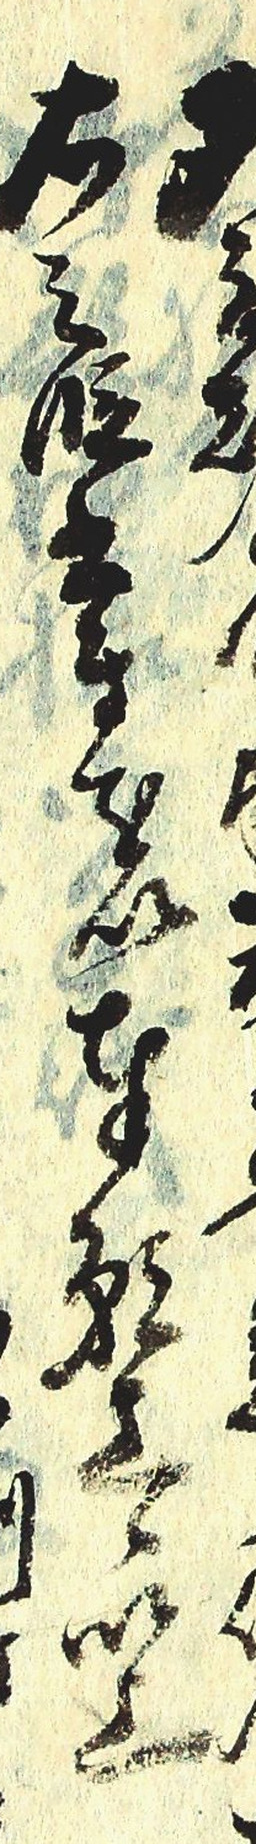右之段書付を以奉願上候以上
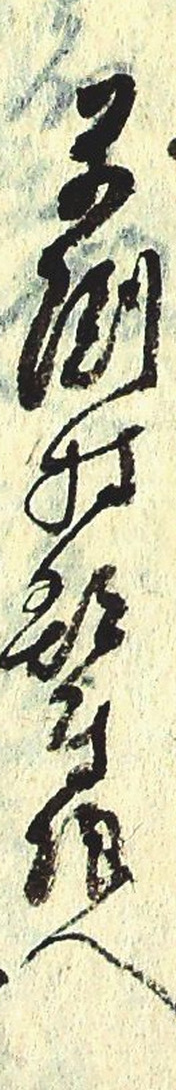早淵村郡付浪人
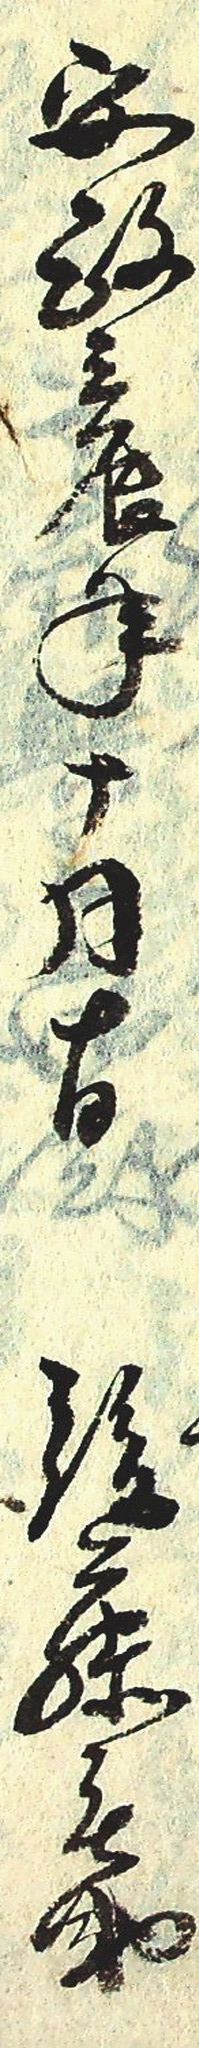安政三辰年十月後藤庄助
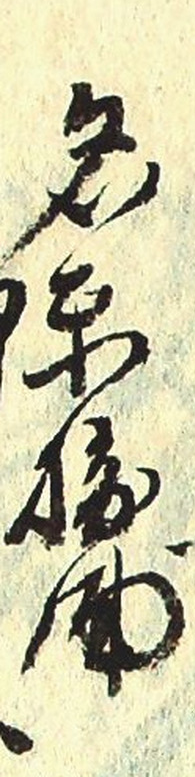名東勝浦
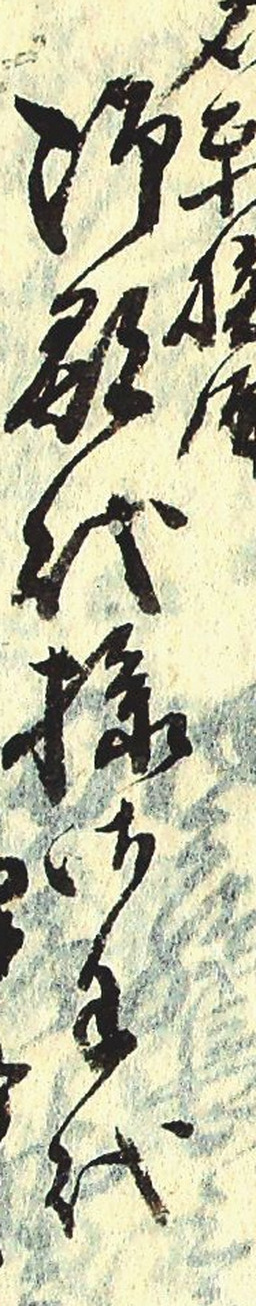御郡代様御手代
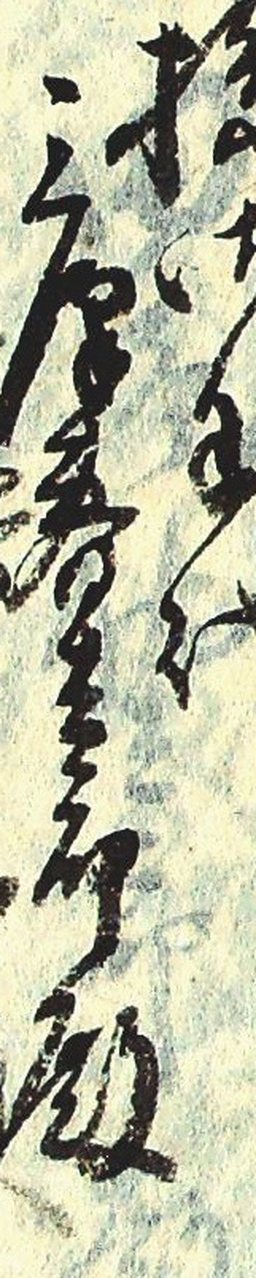三沢春太郎殿
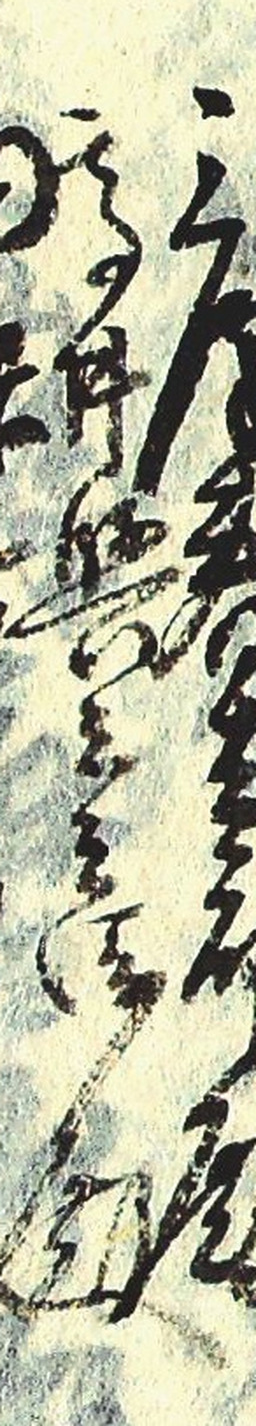高井与三兵衛殿
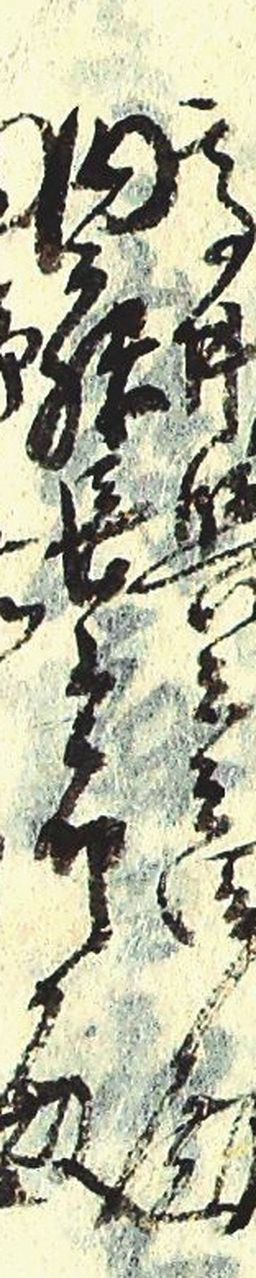内藤長三郎殿
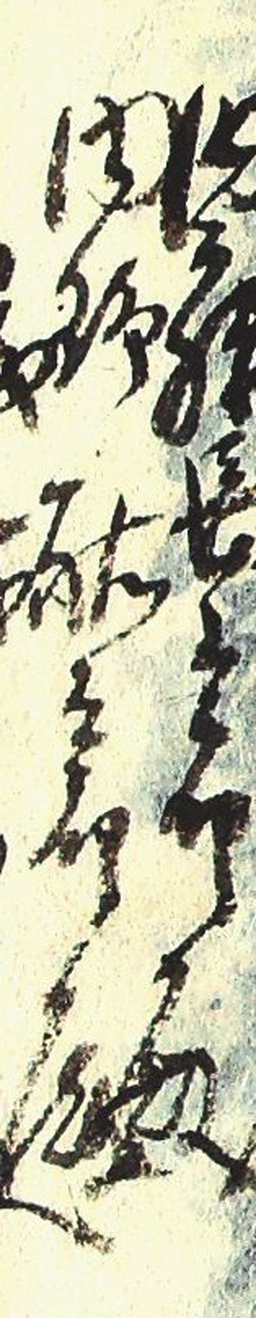田野祐太郎殿
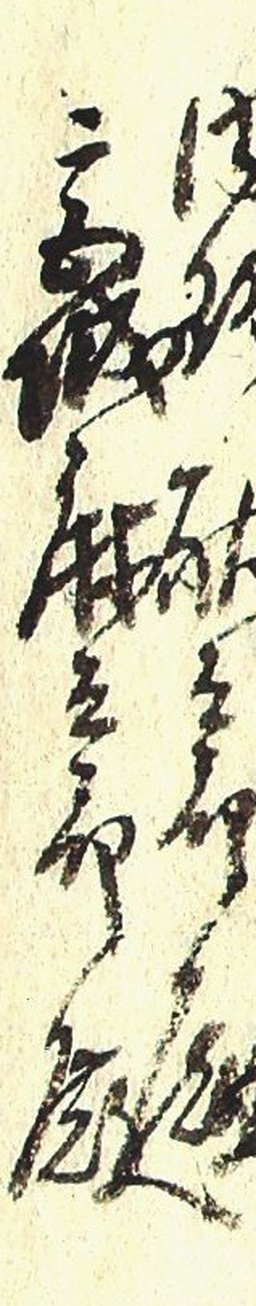宮城麻太郎殿

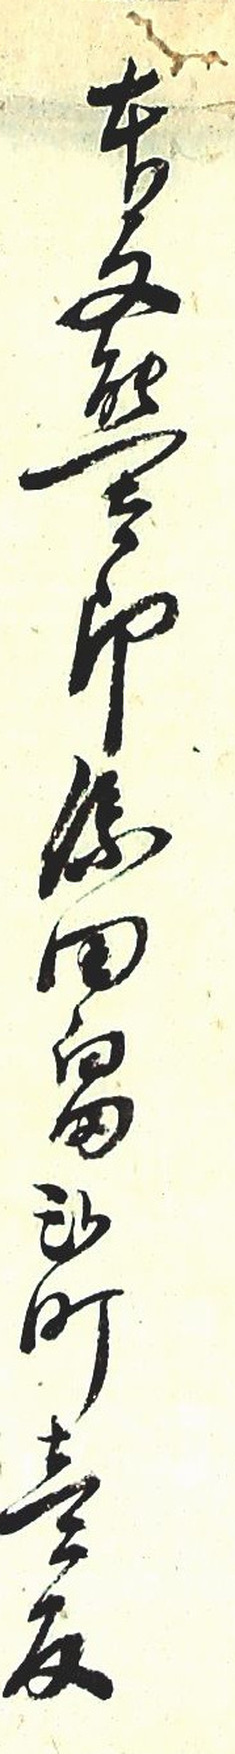本文熊太郎儀田畠弐町壱反
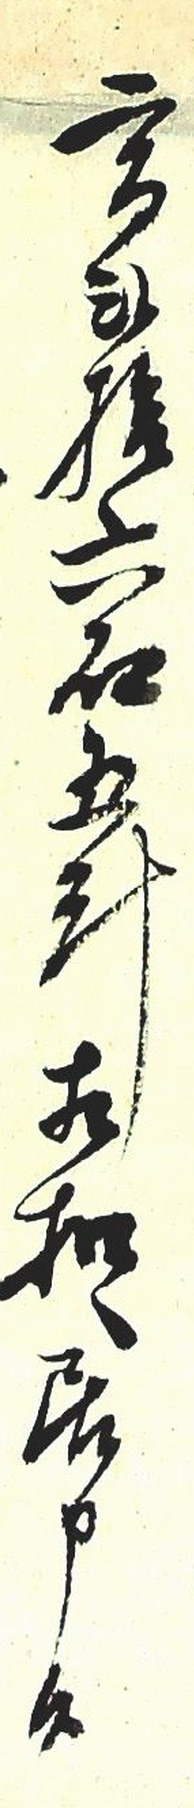高弐拾六石五斗相扣へ居申候
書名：諸御願書控(弐番）
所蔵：鳴門教育大学 Naruto University of Education
